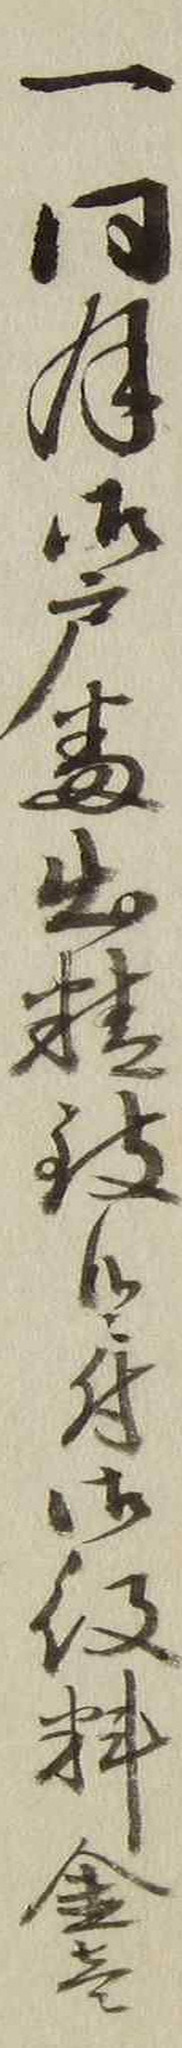一同月御戸番出精致候ニ付御役料金壱
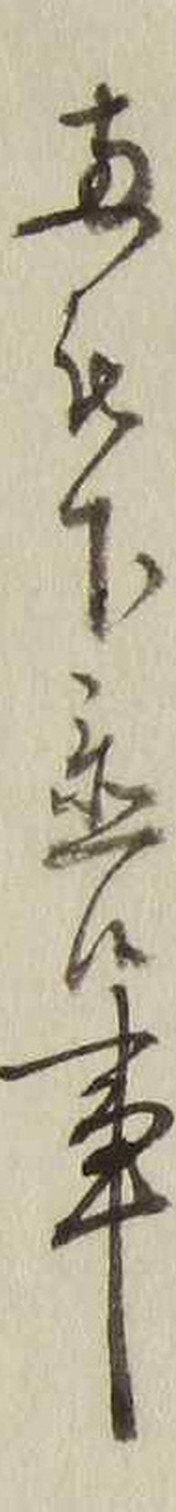両被下置候事

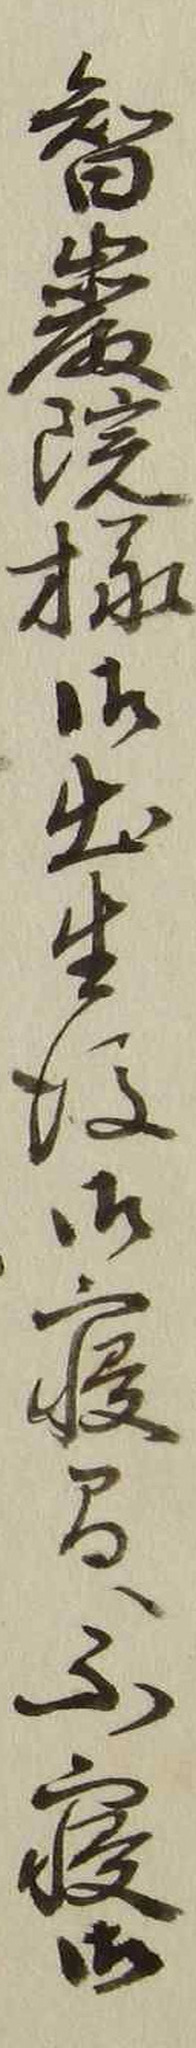智厳院様御出生後御寝間へ不寝御
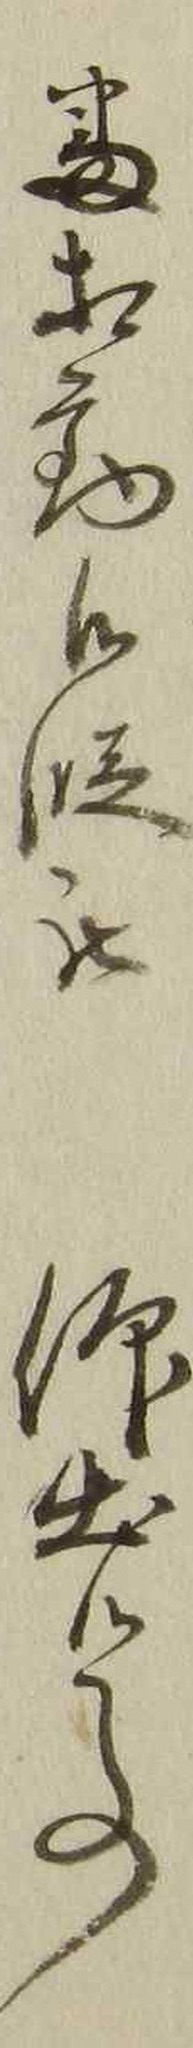番相勤候段被仰出候事
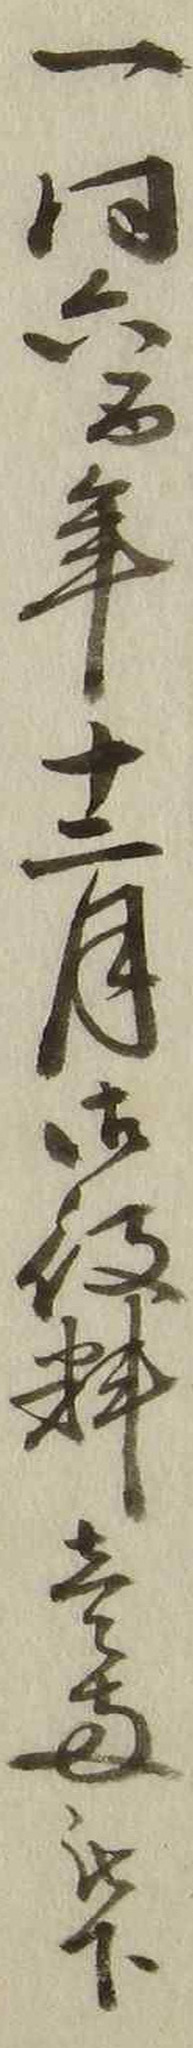一同六酉年十二月御役料壱両被下
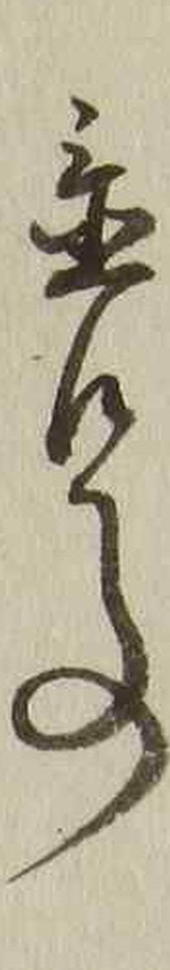置候事
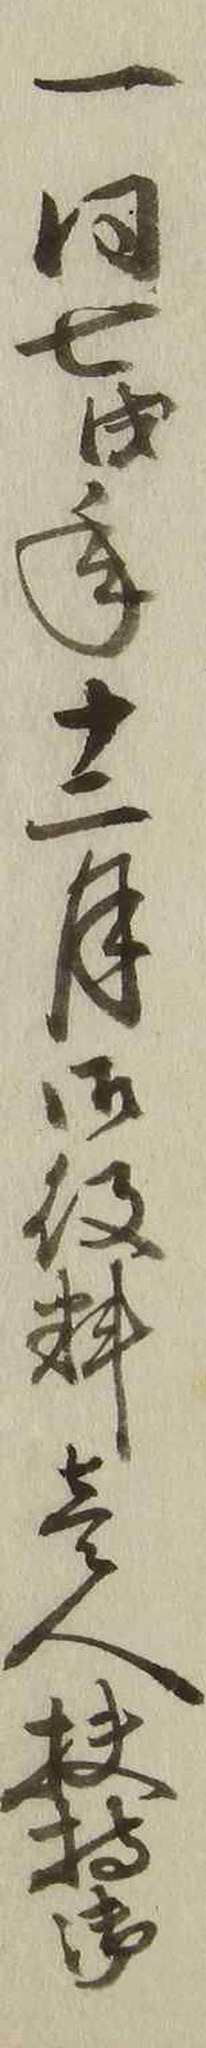一七戌年十二月御役料壱人扶持御
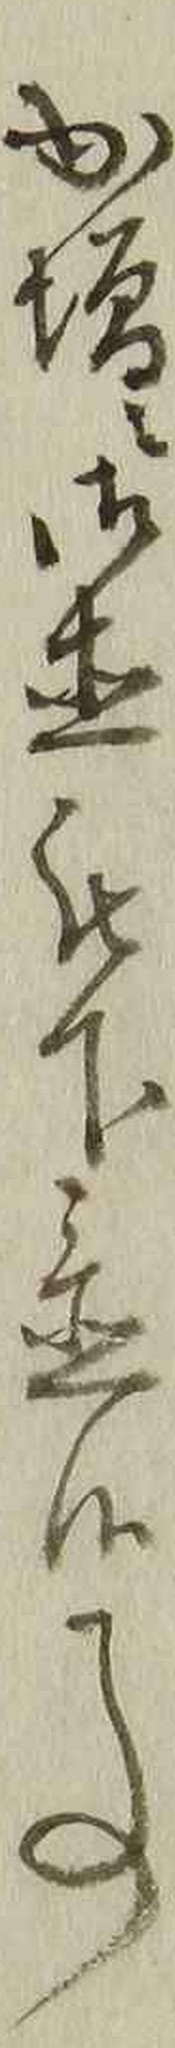加増ニ御直被下置候事
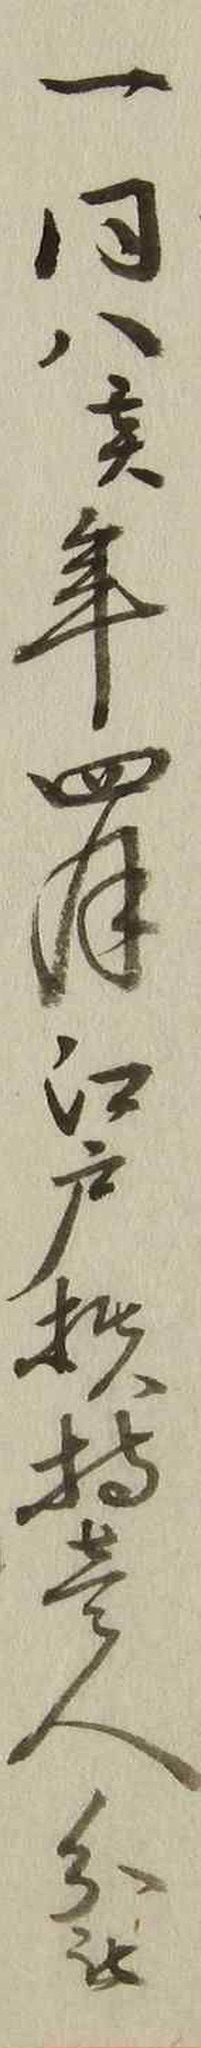一同八亥年四月江戸扶持壱人分被
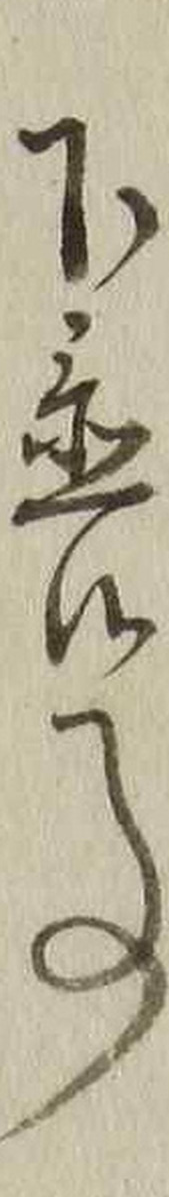下置候事
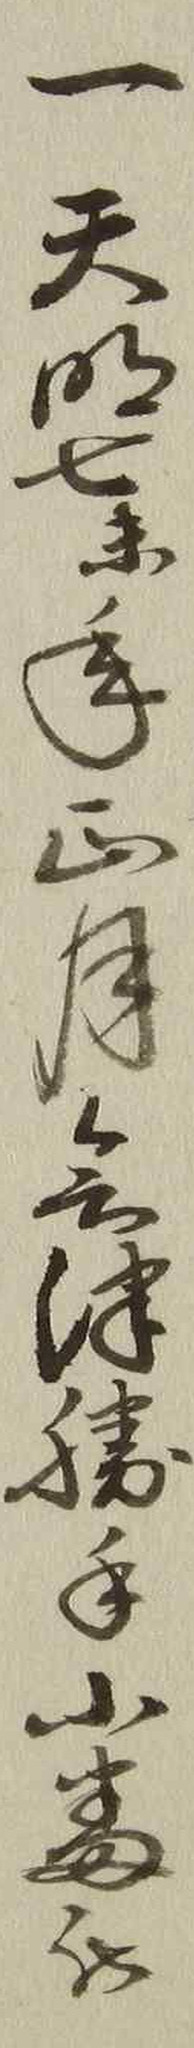一天明七未年正月会津勝手小番被
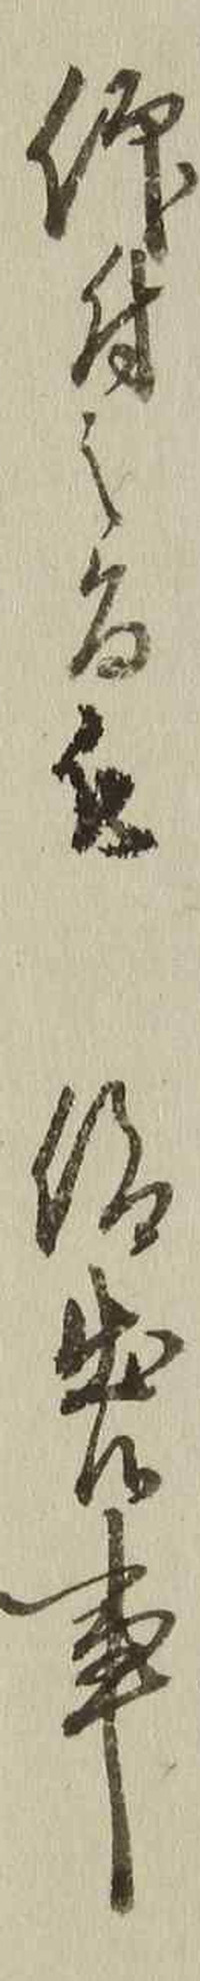仰付之旨被仰出候事
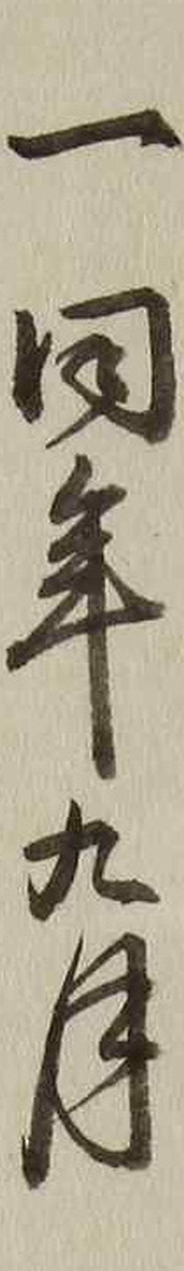一同年九月
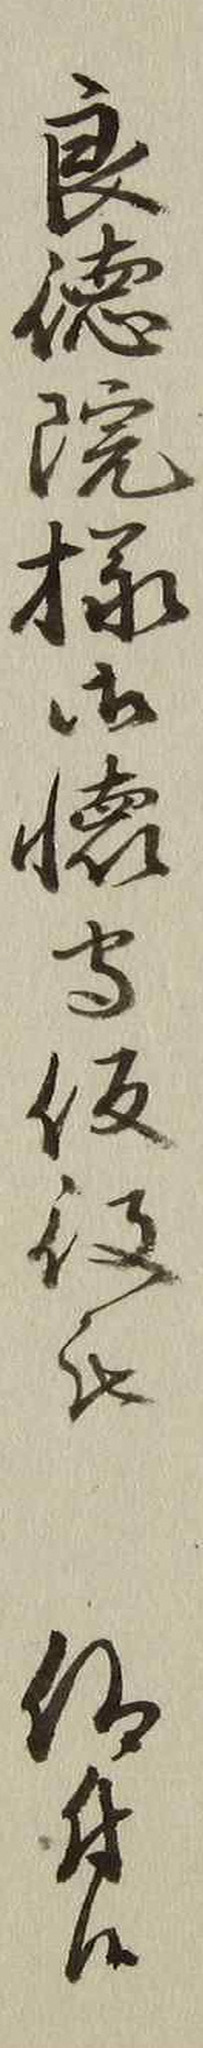良徳院様御懐守仮役被仰付候
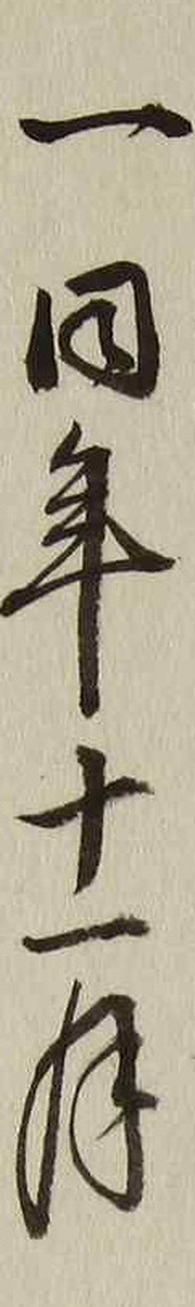一同年十一月
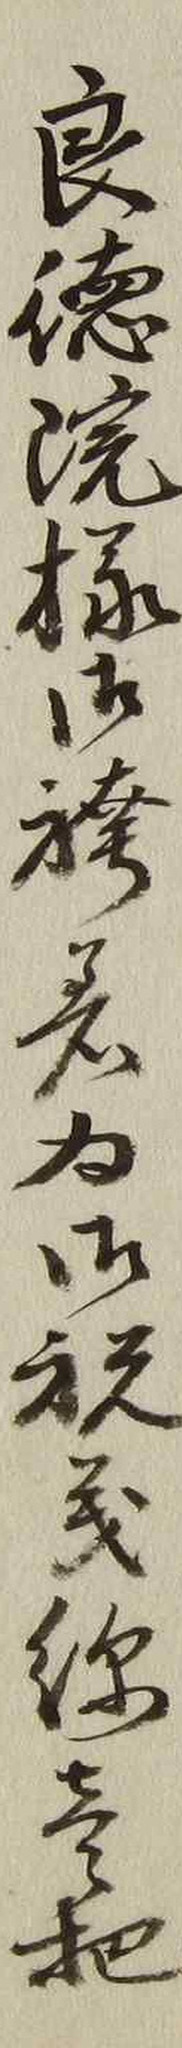良徳院様御袴着為御祝儀綿壱把
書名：諸士系譜　巻之31　い之部31
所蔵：会津若松市立会津図書館
